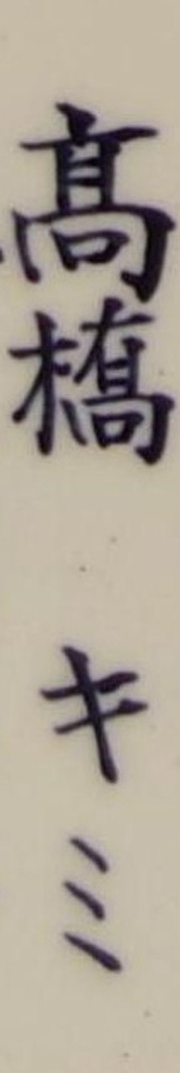高橋キミ
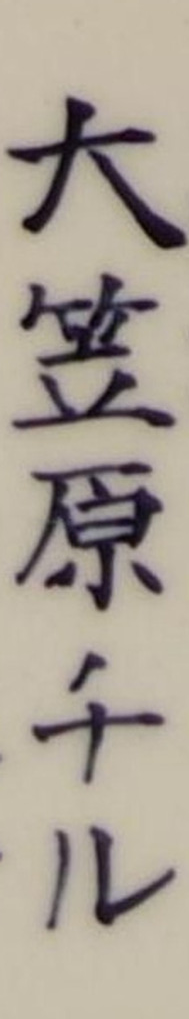大笠原チル
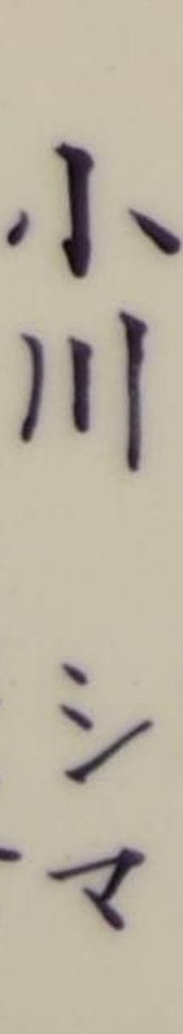小川シマ

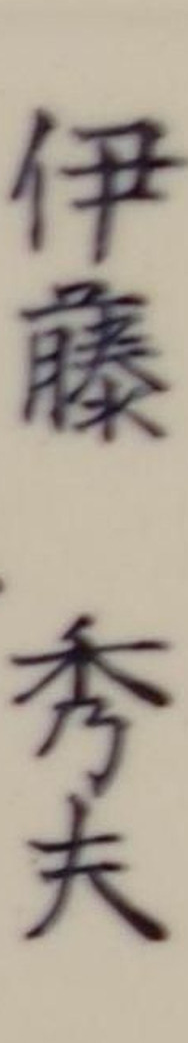伊藤秀夫
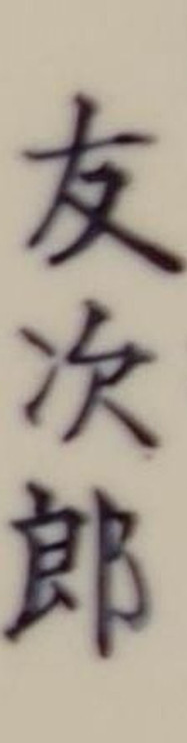友次郎
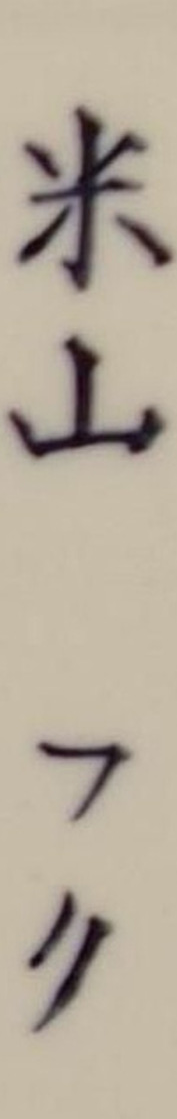米山フク
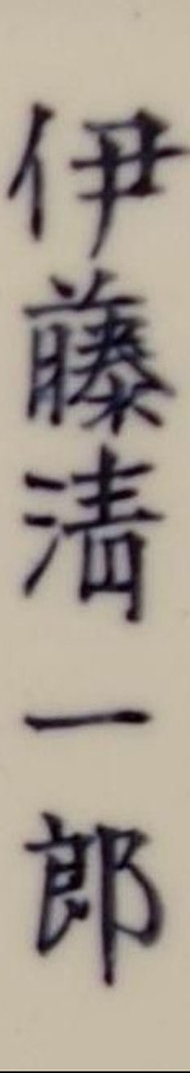伊藤清一郎
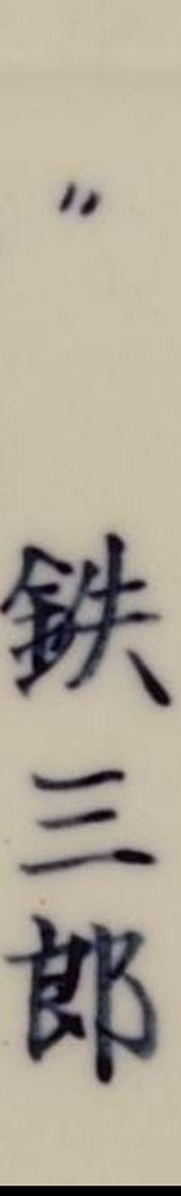鉄三郎
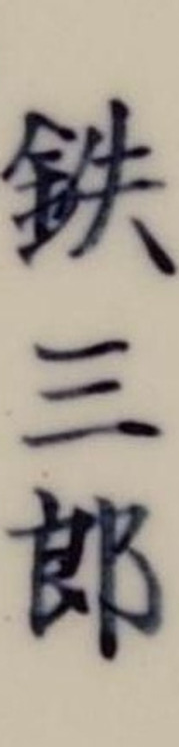鉄三郎
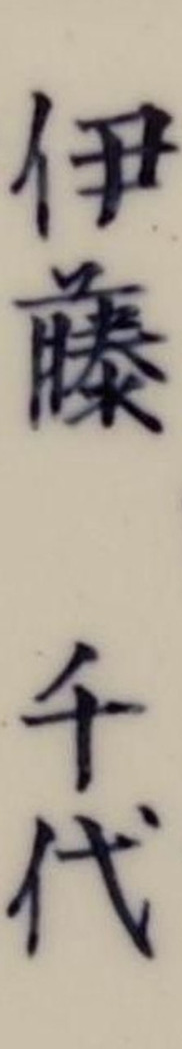伊藤千代
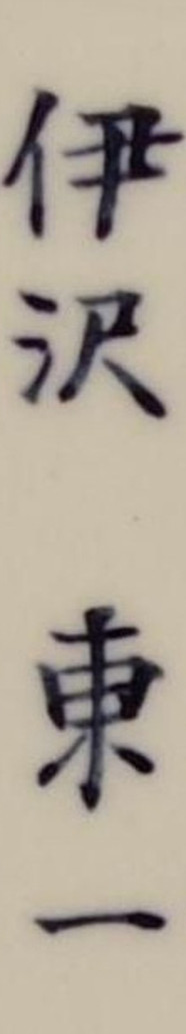伊沢東一
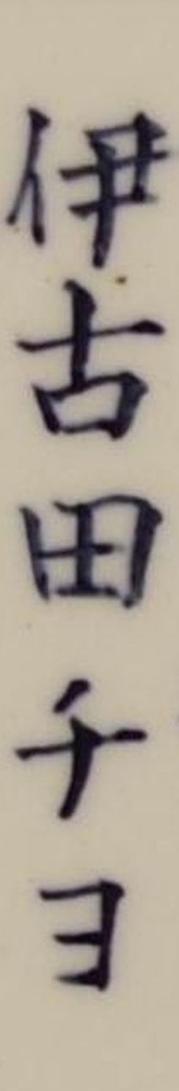伊古田チヨ
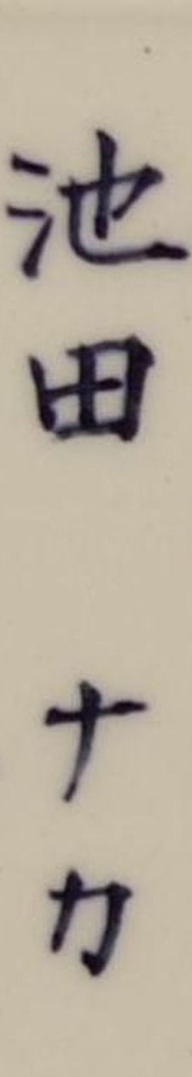池田ナカ
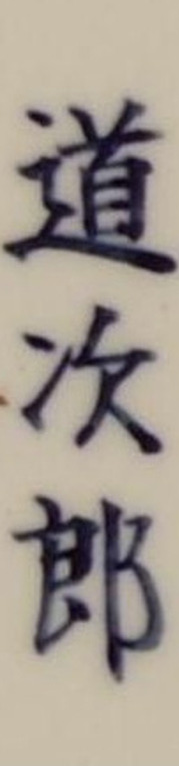道次郎
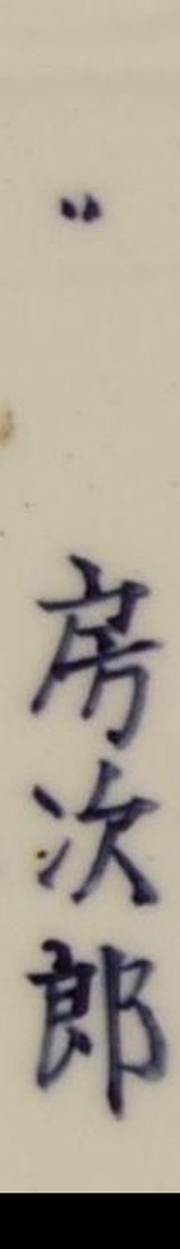房次郎
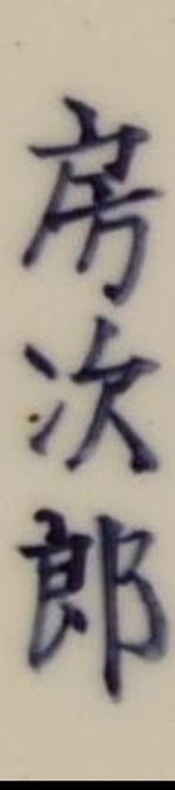房次郎
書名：M~S
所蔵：高野山金剛峯寺
